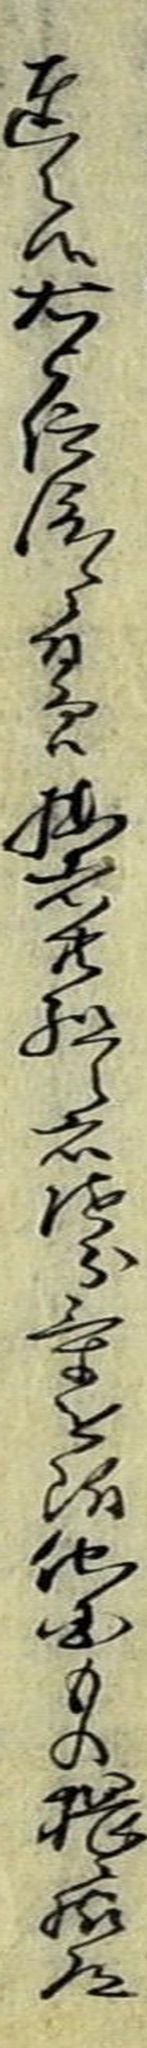達之候右被仰渡候に付而は拙者共組之者随分気を附他国もの猥に脇道
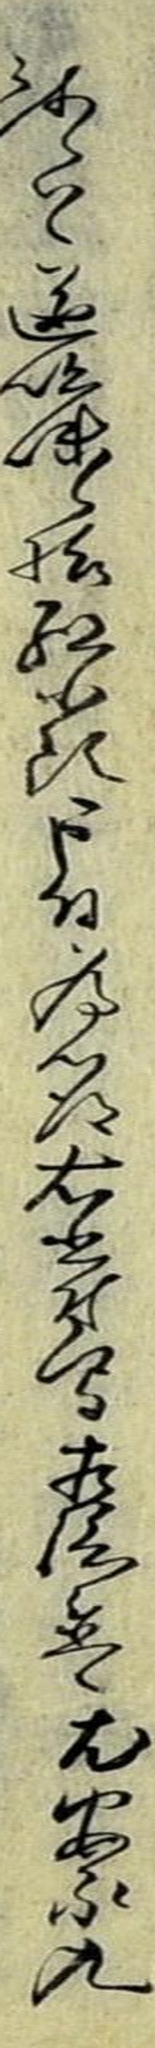致候はゝ遂吟味候様組小頭へ申付為心得右書付之写相渡置候尤安永九
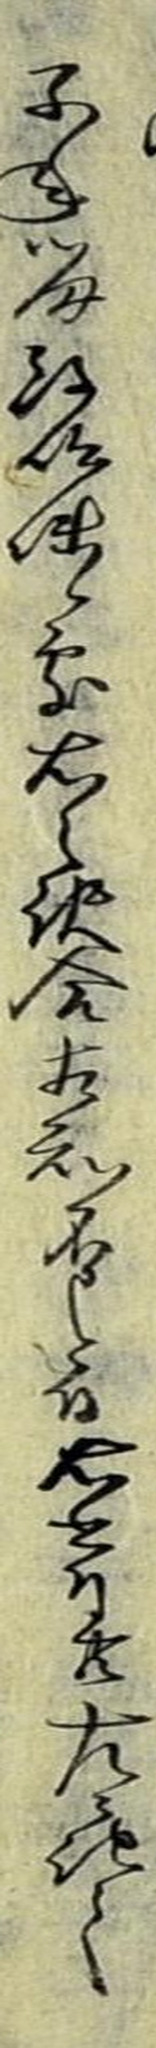子年留致吟味候処右之訳合相知不申に付右書付共左に記之
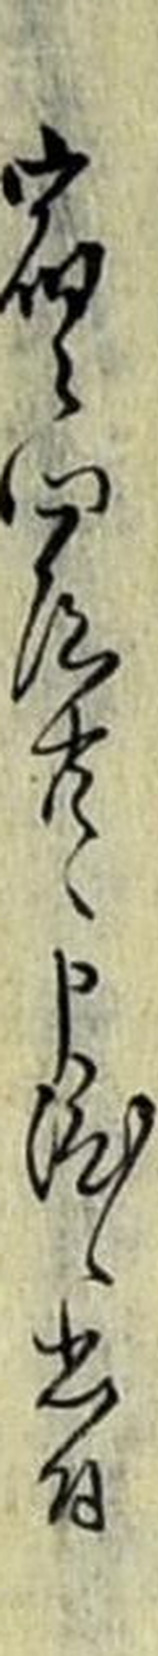宿々問屋共へ申渡候書付
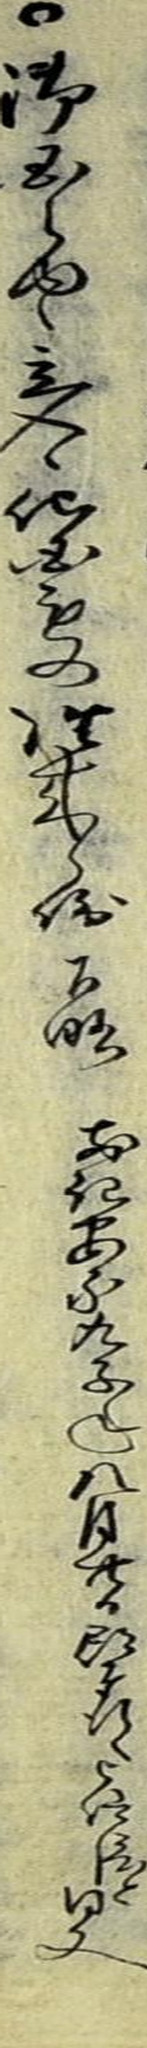〇御国之内へ立入候他国もの往来之儀下略前記安永九子年八月廿日郡奉行へ被仰渡と同文
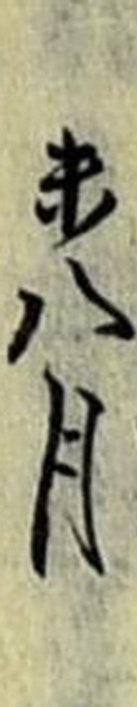未八月
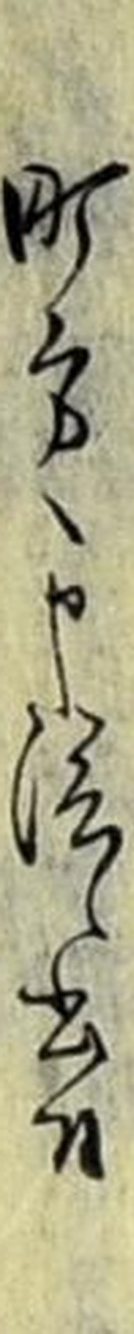町方へ申渡候書付
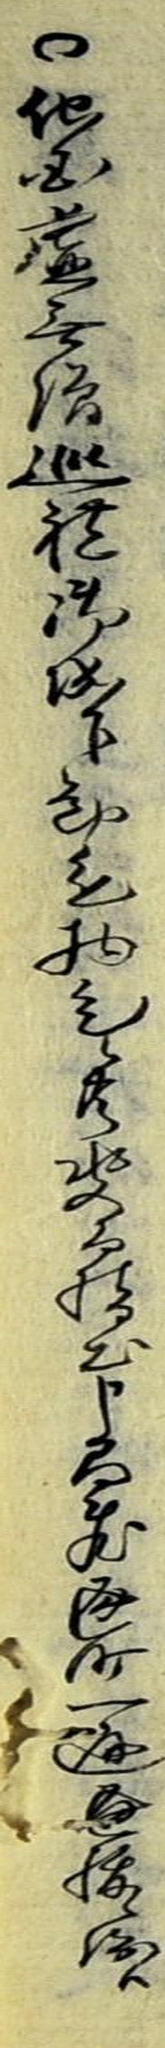〇他国虚無僧巡礼御城下勧進物乞候共決而指出申間敷通町一通通抜候儀は

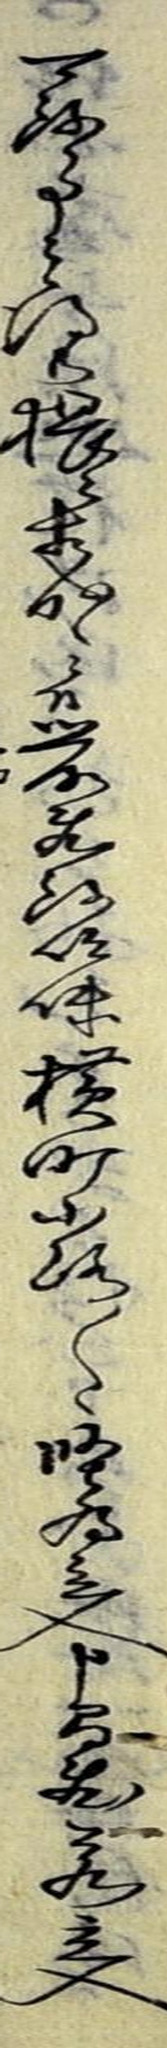可致事に候得共猥に相成候に付厳敷致吟味横町小路〳〵へ堅為立入申間敷若立入
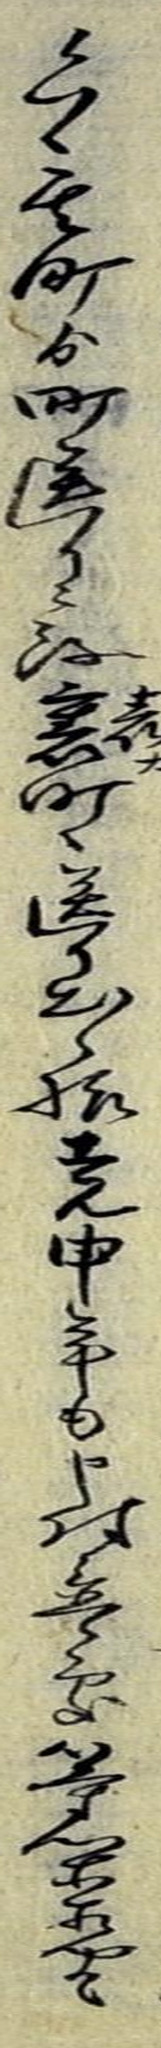候はゝ其町ゟ町送りに致裏町へ送り出候様去る申年も申付置候処等閑相聞候
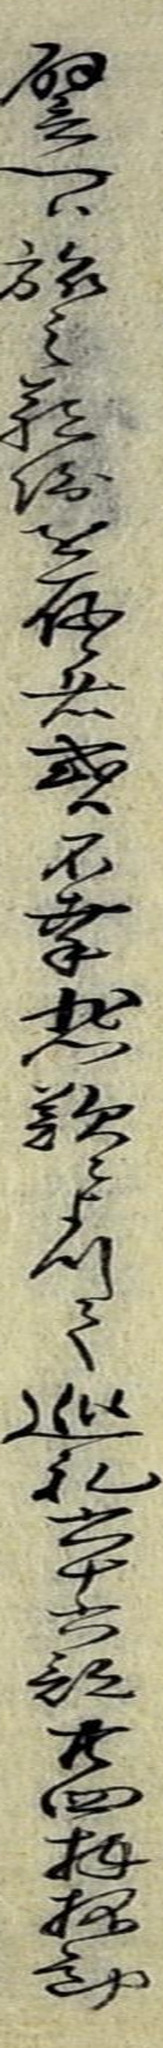譬へは旅之難儀を存候者或は不幸悲嘆によつて巡礼六十六部廿四拝抔勧
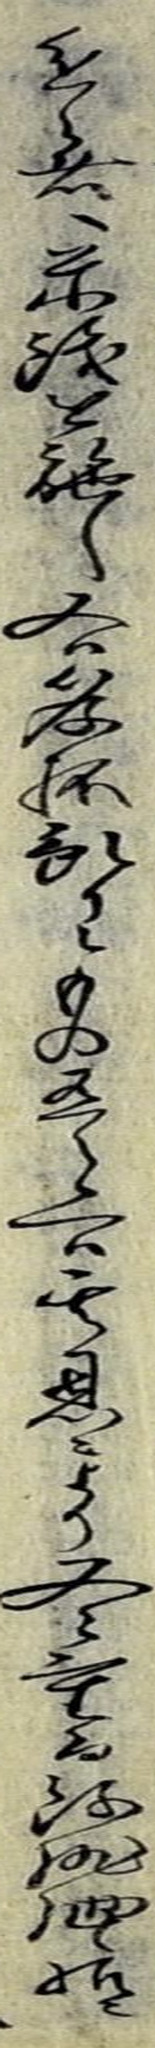進之者へ米銭を施し又は笈抔預り候もの有之候へは其恩により又々重而致徘徊候様に
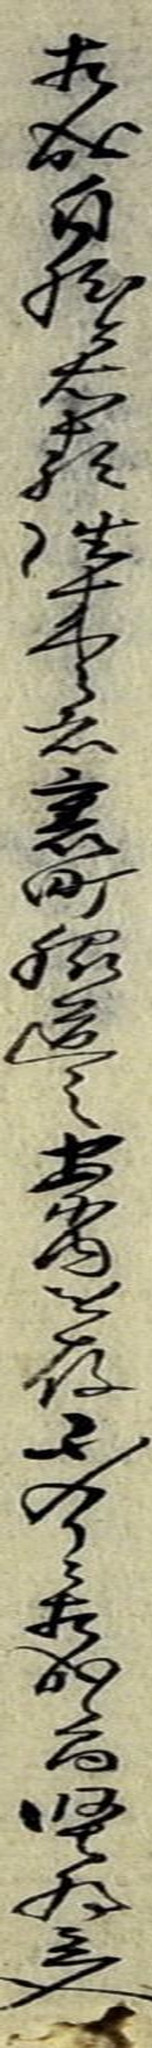相成自然と右類往来之者裏町脇道之案内を存不〆りに相成候間堅為立入
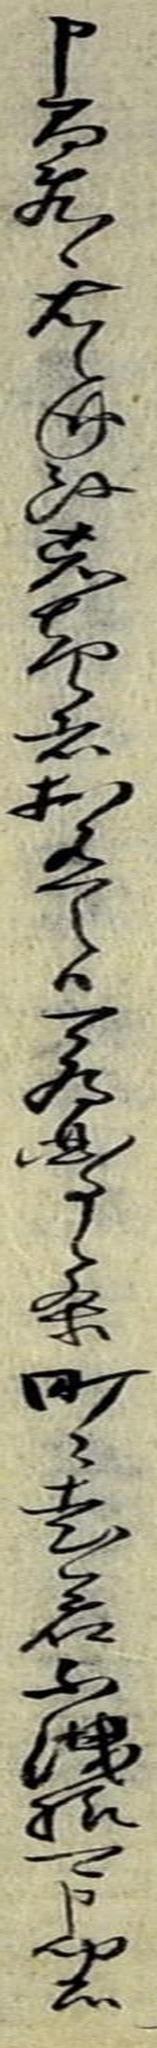申間敷候右之趣致忘却候者於有之は可為曲事候条町々老若不洩様可申聞候
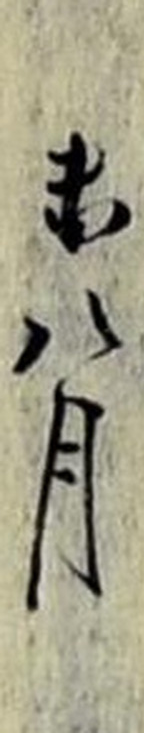未八月
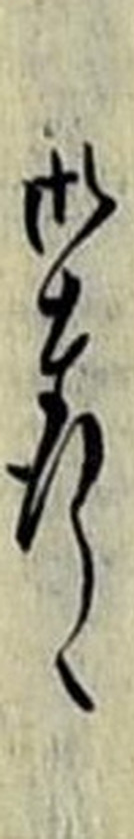御奉行へ
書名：命令之部 二
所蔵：福井県文書館 Fukui Prefectural Archives
